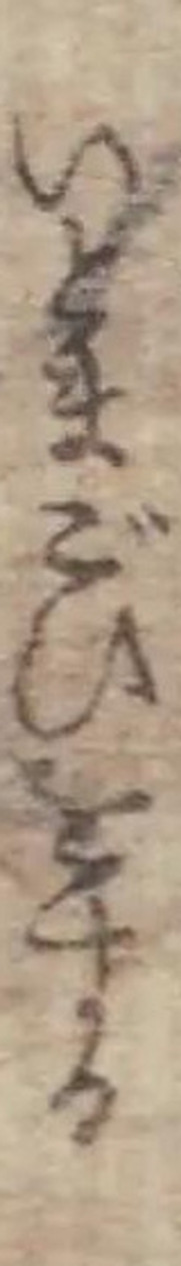いとまごひをする

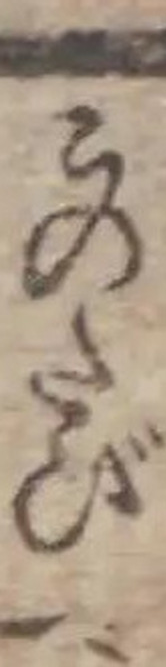このたび
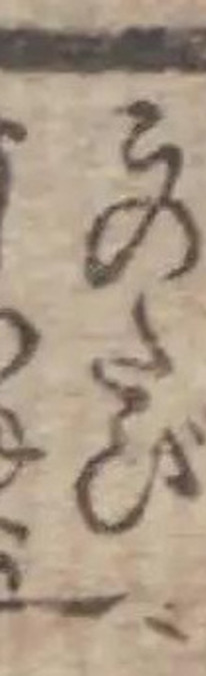このたび
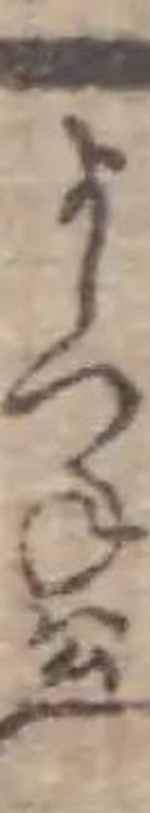よしつね公
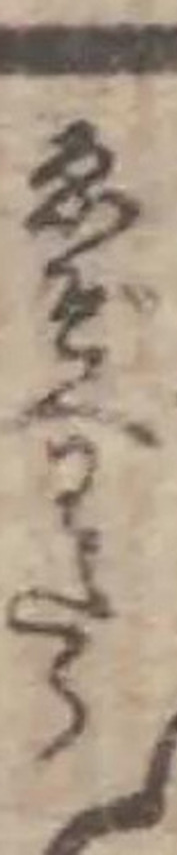ゑぞへわたら
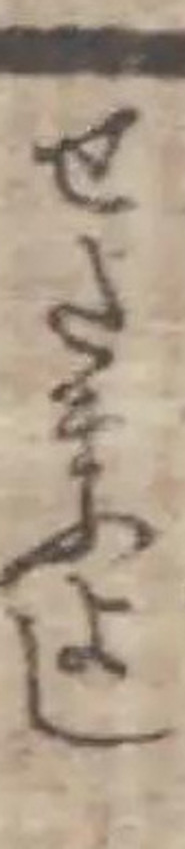せたまふよし
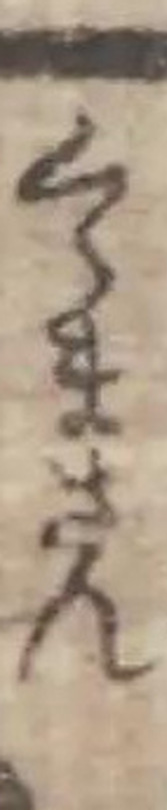くらまさん
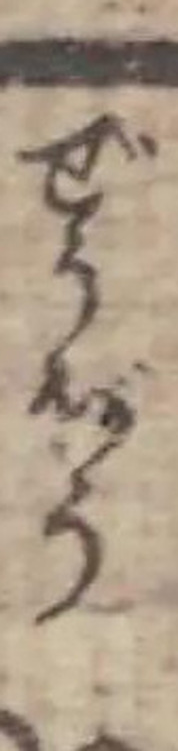ぜうぼう
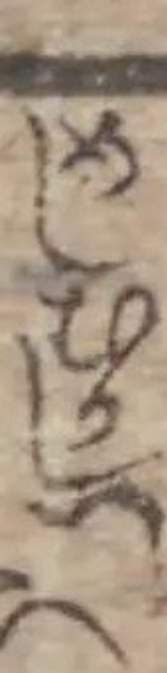めしむかし
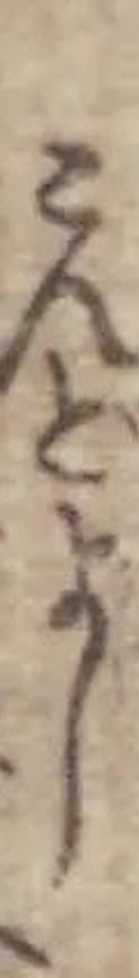こんどよし
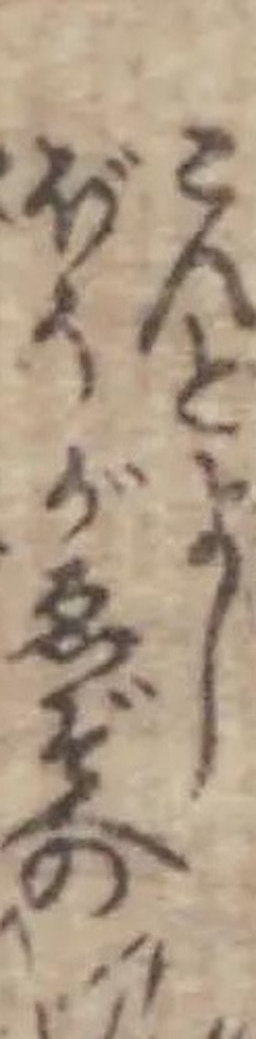ぼうがゑぞへの
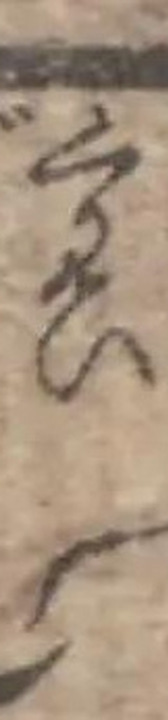くわい
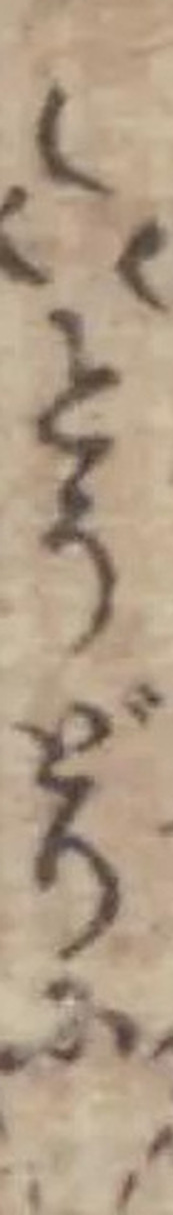とうどりに
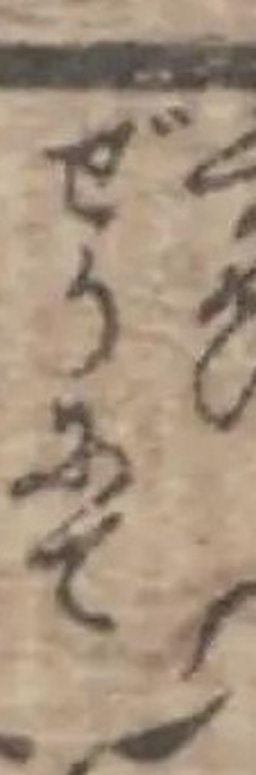ぜうにて
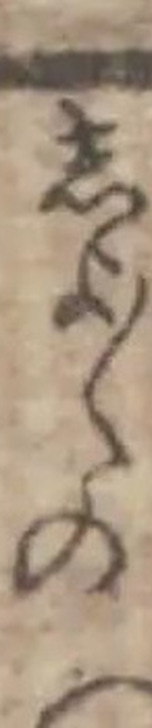しよ〳〵の
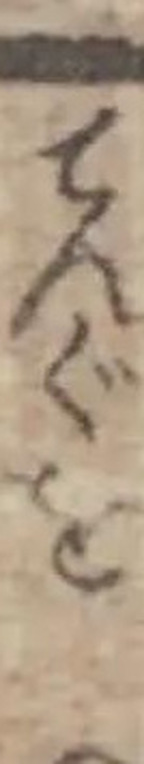てんぐを
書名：草紙の曙 3巻
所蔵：国立国会図書館 National Diet Library, JAPAN
